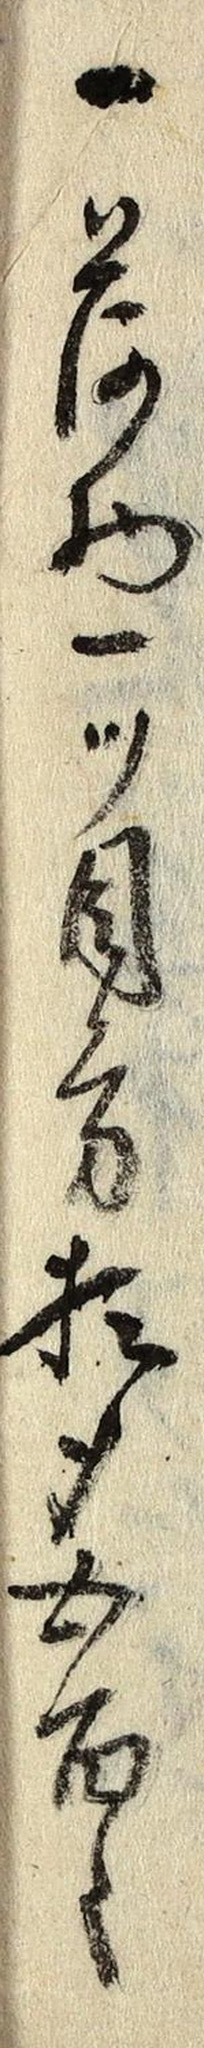一荷物一ツ目方拾貫五百匁
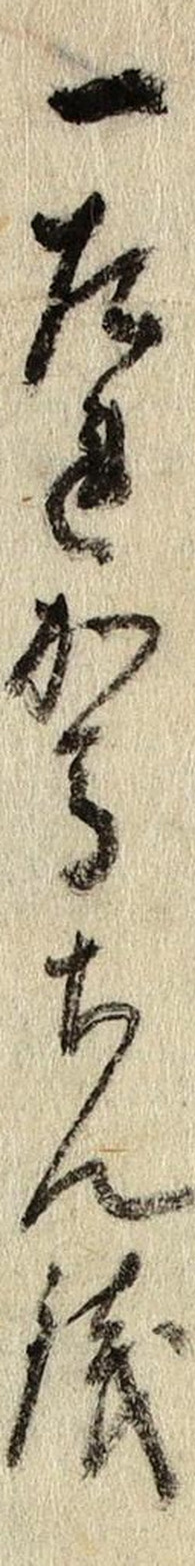一たれ駕ちん銭
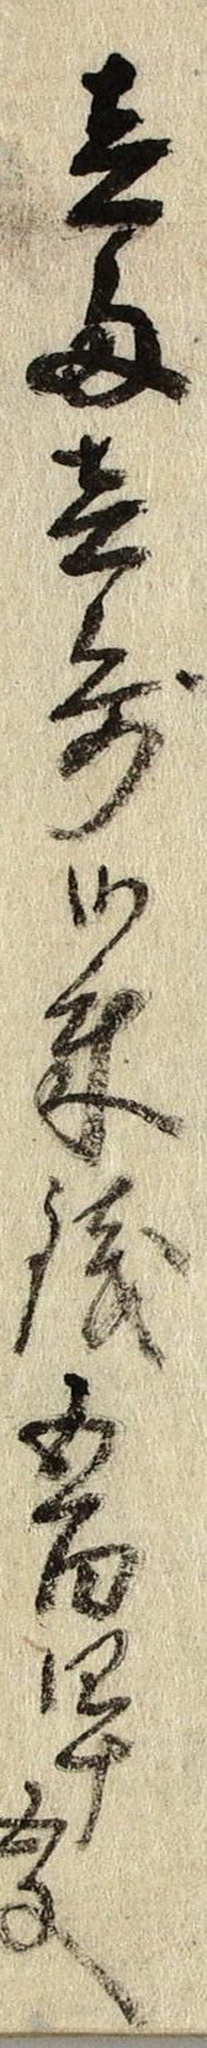壱両壱歩弐朱銭五百四十
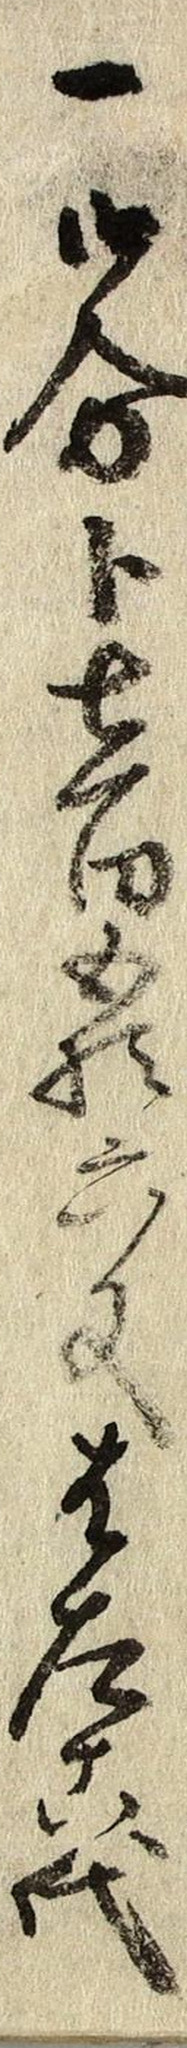一弐分ト七百五拾六文はたこ代

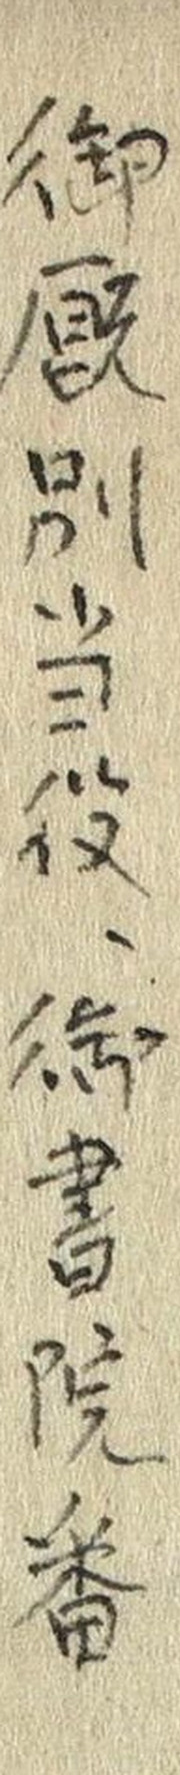御厩別当役、御書院番
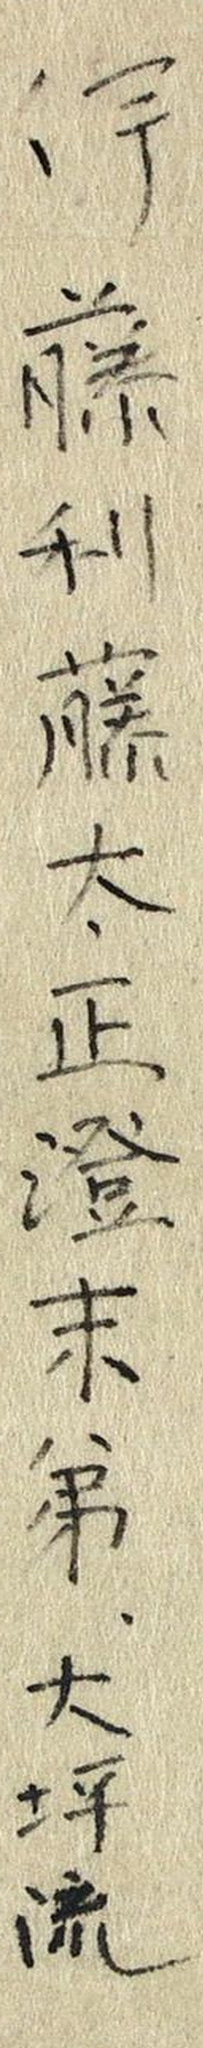伊藤利藤太正澄末弟、大坪流
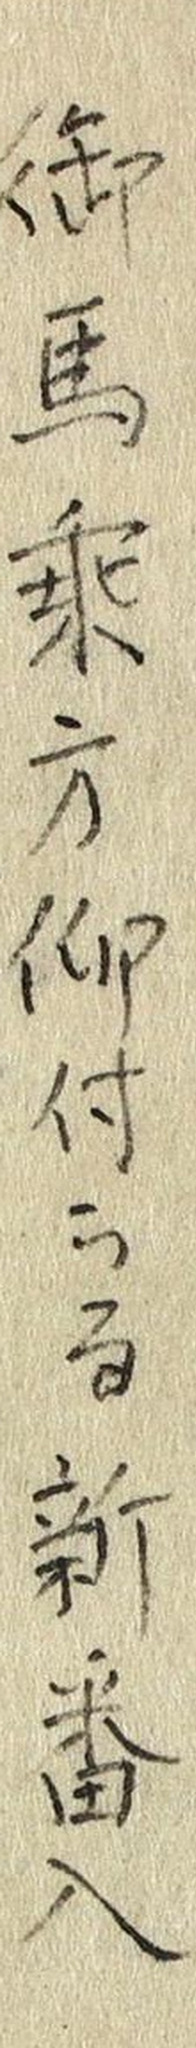御馬乗方仰付らる新番入
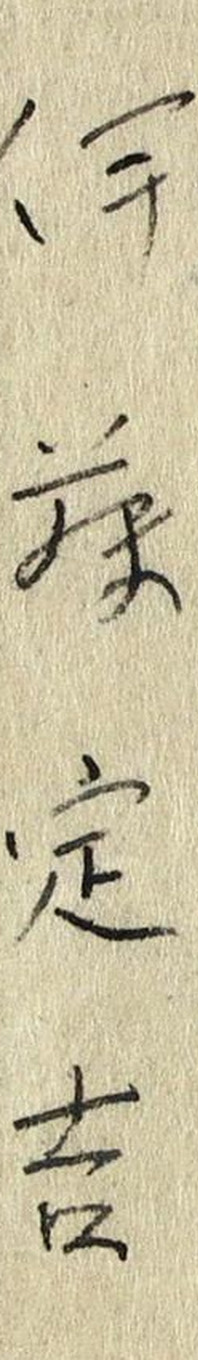伊藤定吉
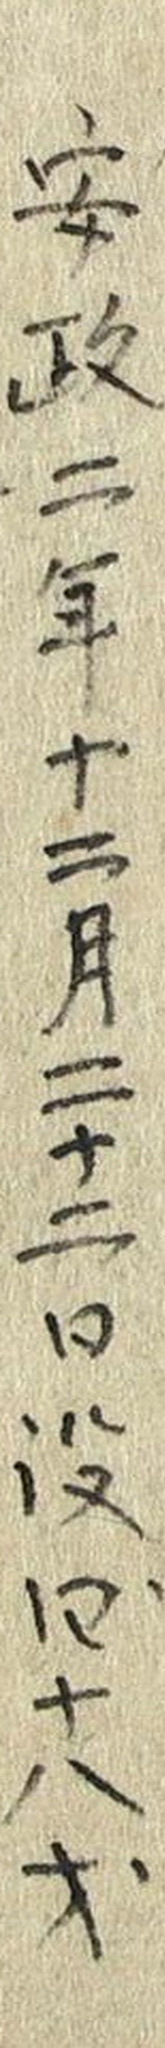安政二年十二月二十二日没四十八才
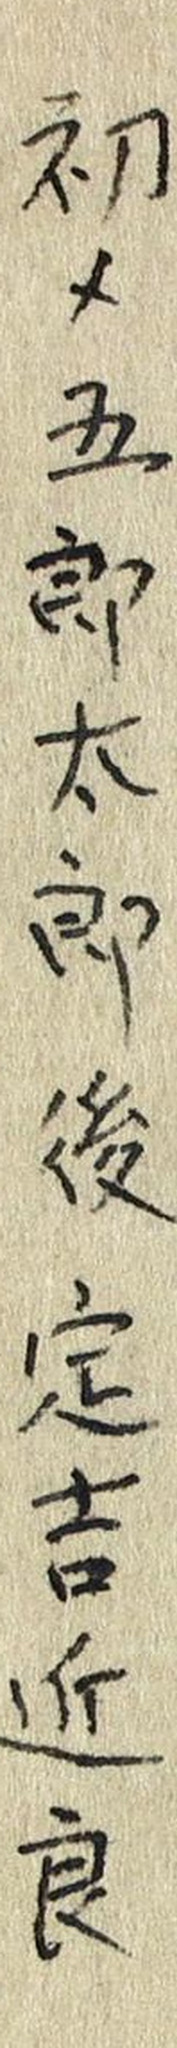初メ五郎太郎後定吉近良
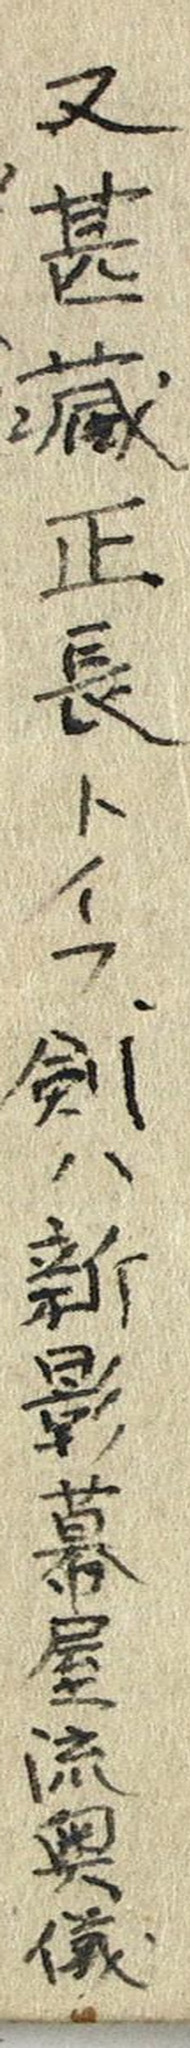又甚蔵正長トイフ、剣ハ新影幕屋流奥儀
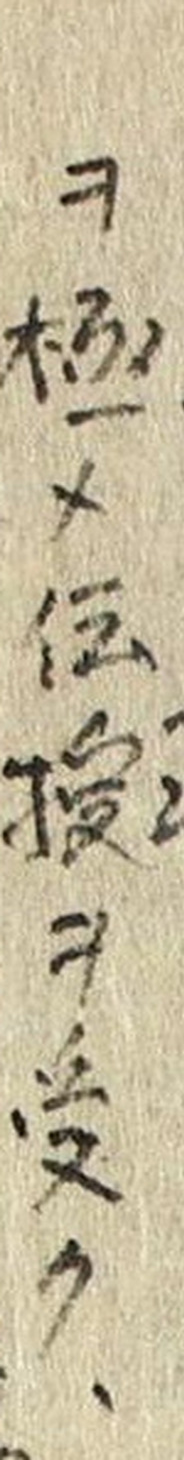ヲ極メ伝授ヲ受ク、
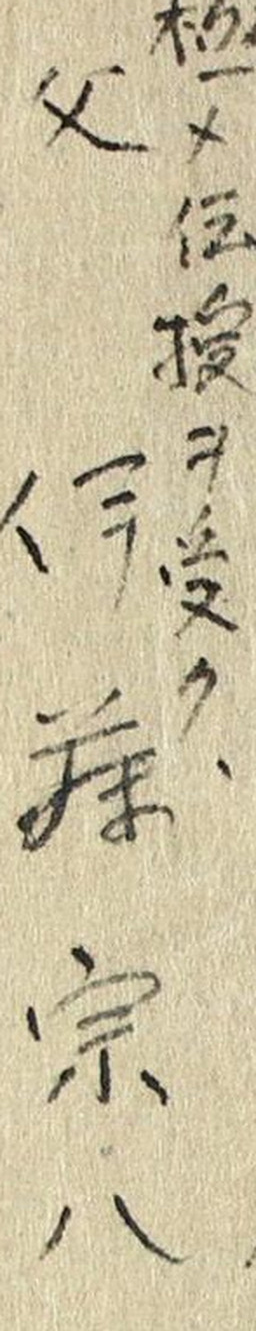父伊藤宗八
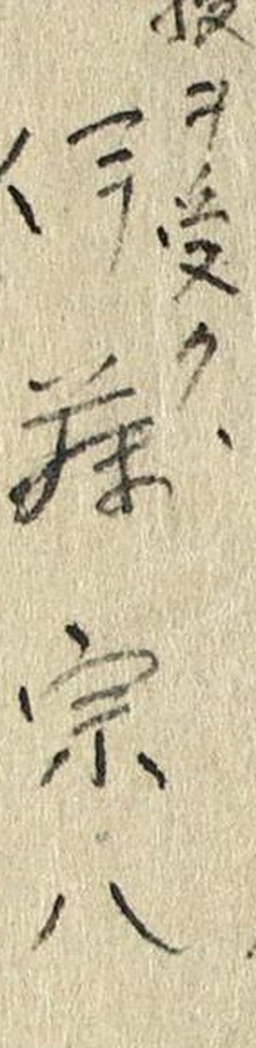父伊藤宗八
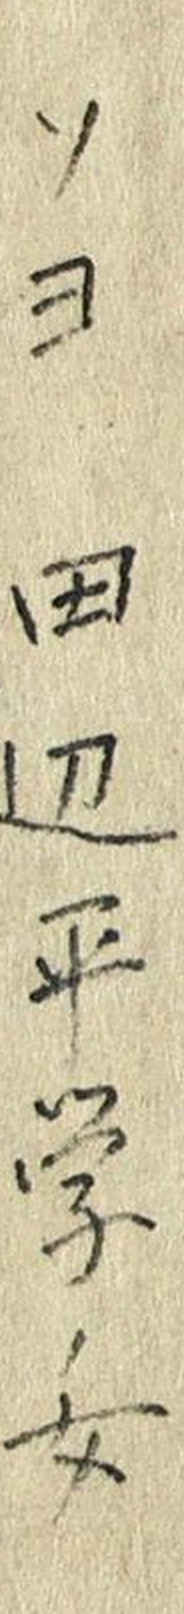母ソヨ田辺平学女
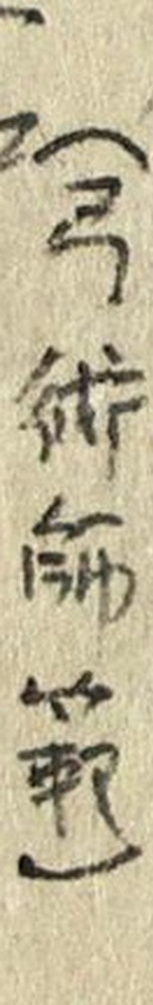弓術師範
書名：中仙道道中覚
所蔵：福井県文書館 Fukui Prefectural Archives
